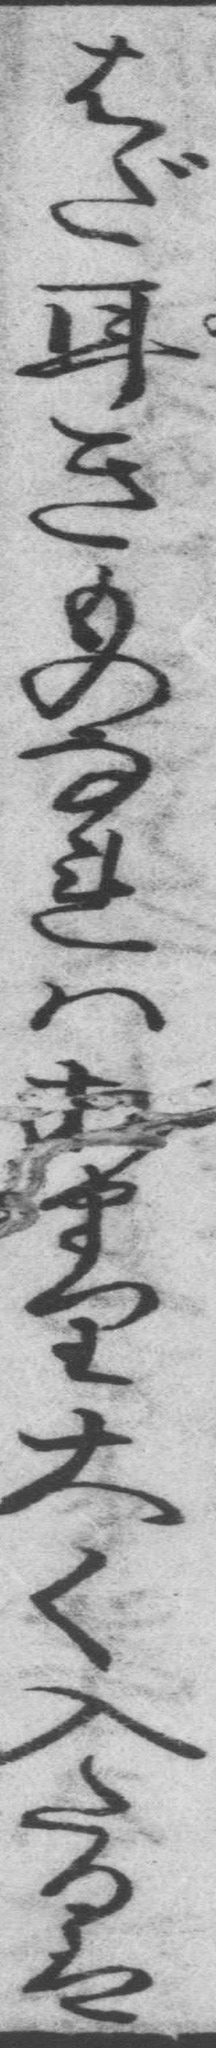はだ甘きものな連はあま里大く入たる盤
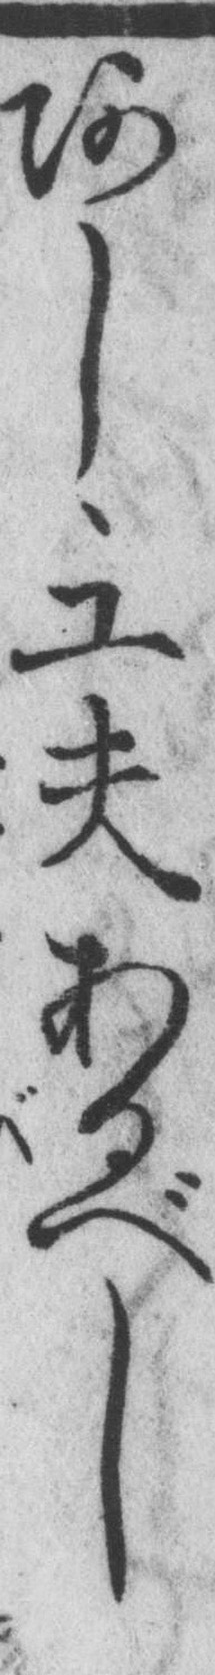阿し工夫あるべし
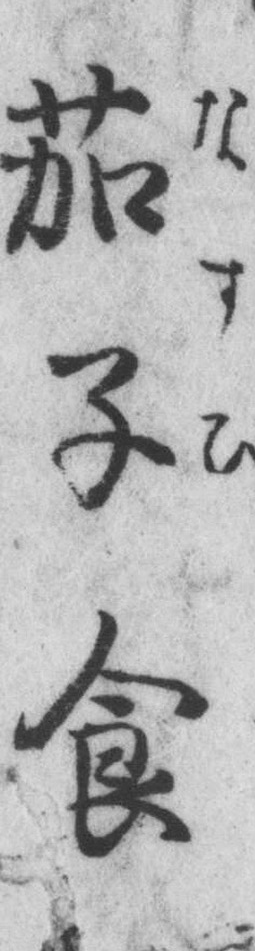茄子食
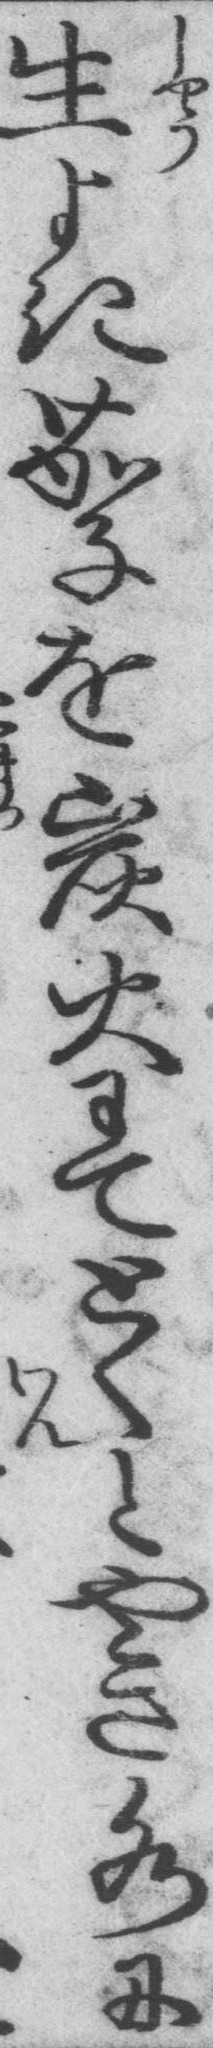生よ起茄子を炭火尓てとくとやき水丹
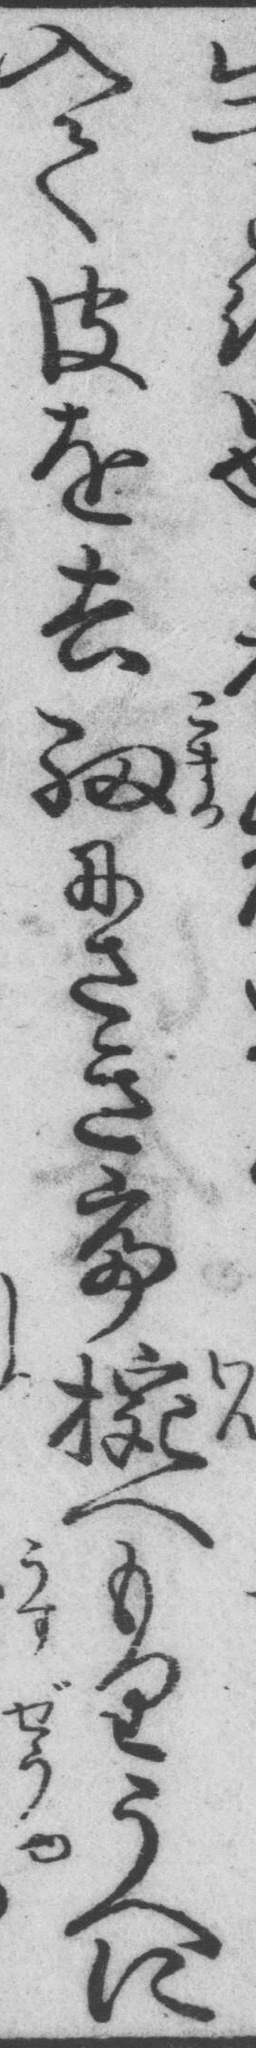入て皮を去細丹さき亭椀へも里うへに
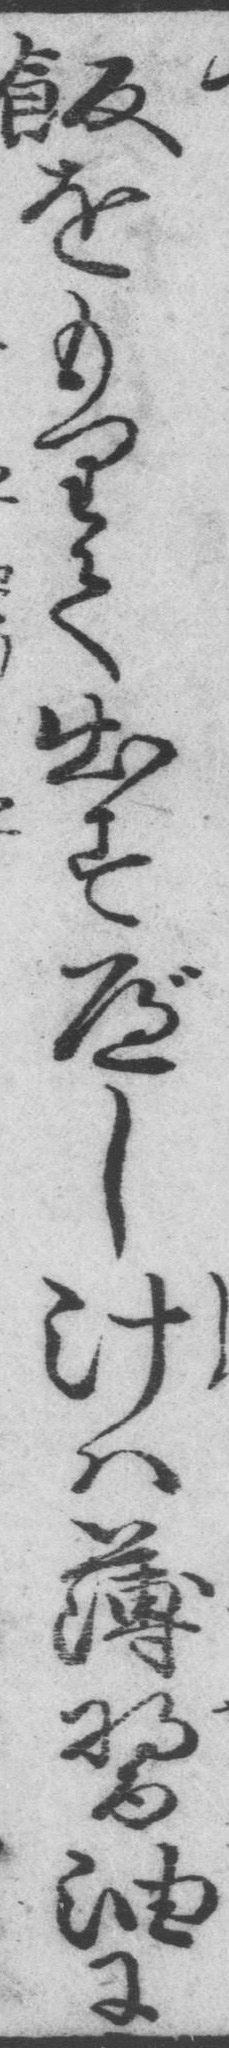飯をも里て出春べし汁は薄醤油尓
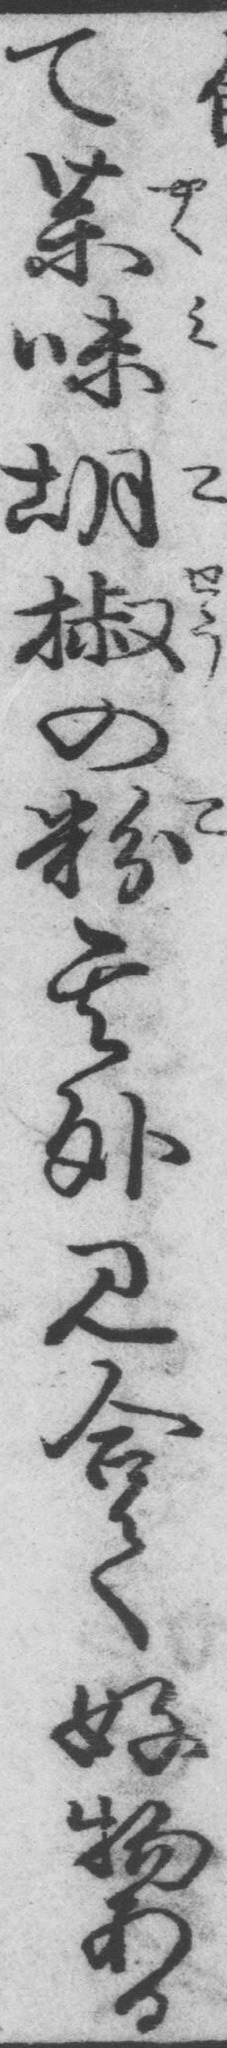て薬味胡椒の粉其外見合て好物ある
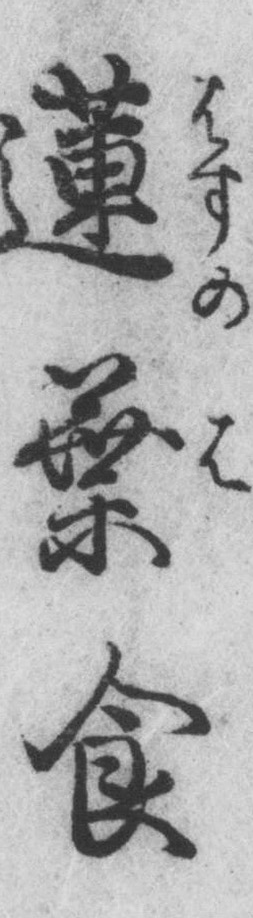蓮葉食
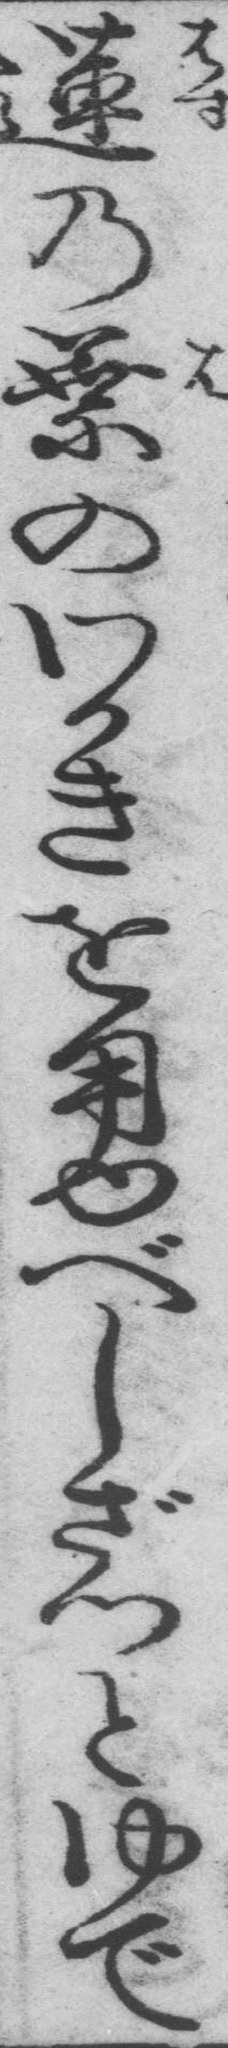蓮乃葉のわかきを用ゆべしざつとゆで

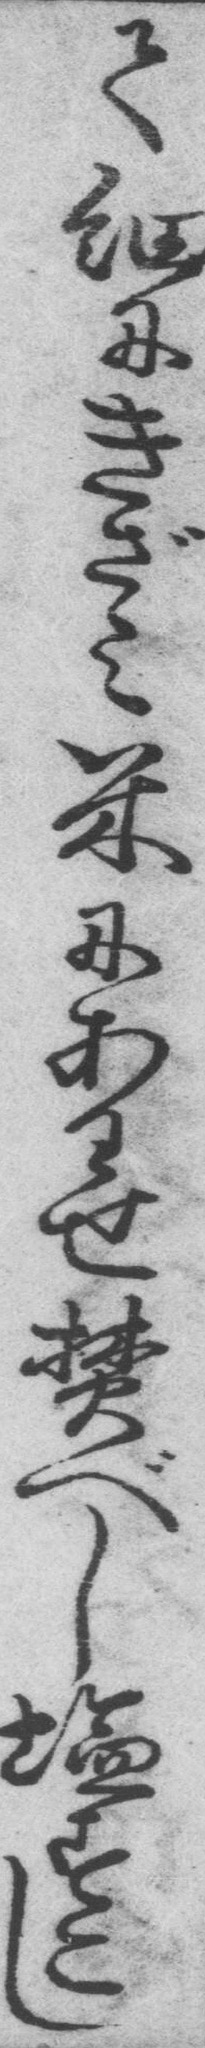て細丹きざみ米丹あわせ焚べし塩春こし
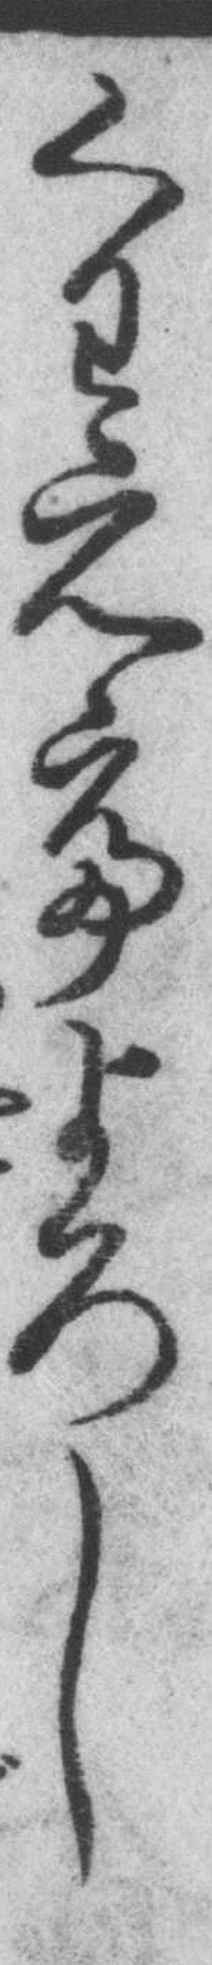くわえ亭よろし
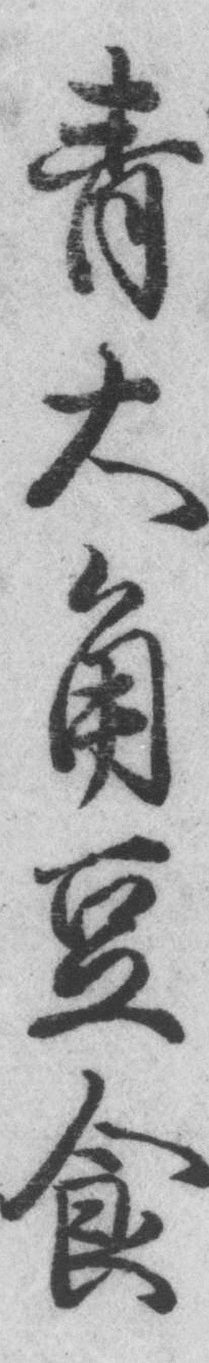青大角豆食
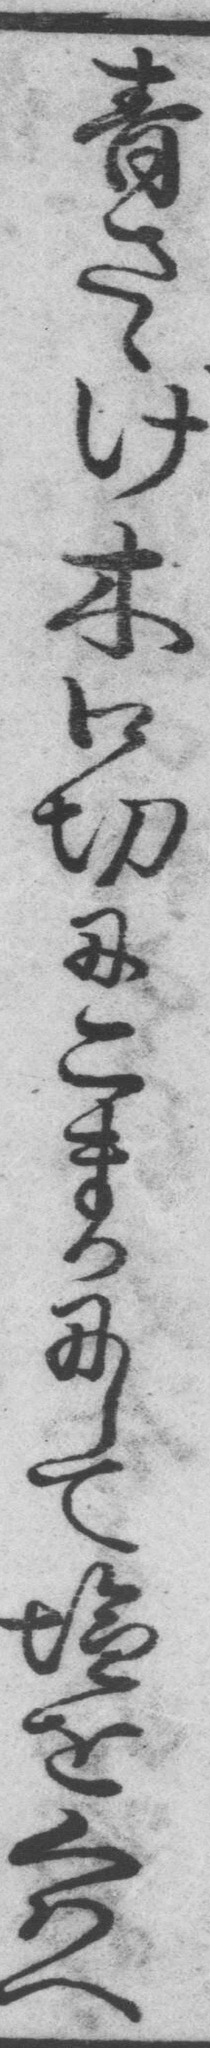青さゝげ木口丹こまか丹して塩をくはへ
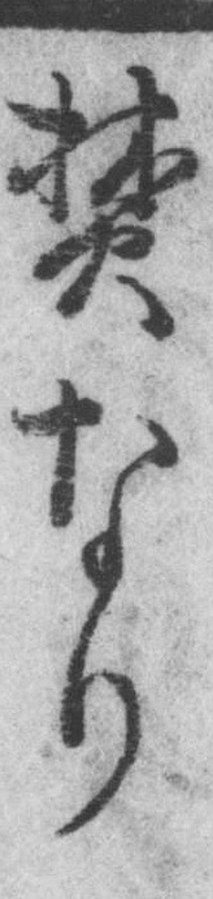焚なり
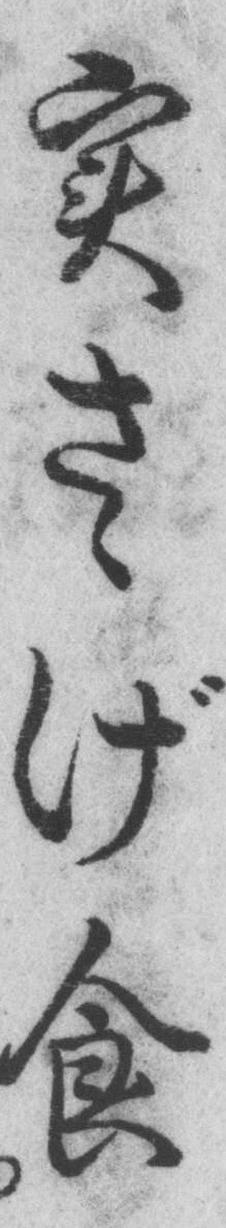実さゝげ食
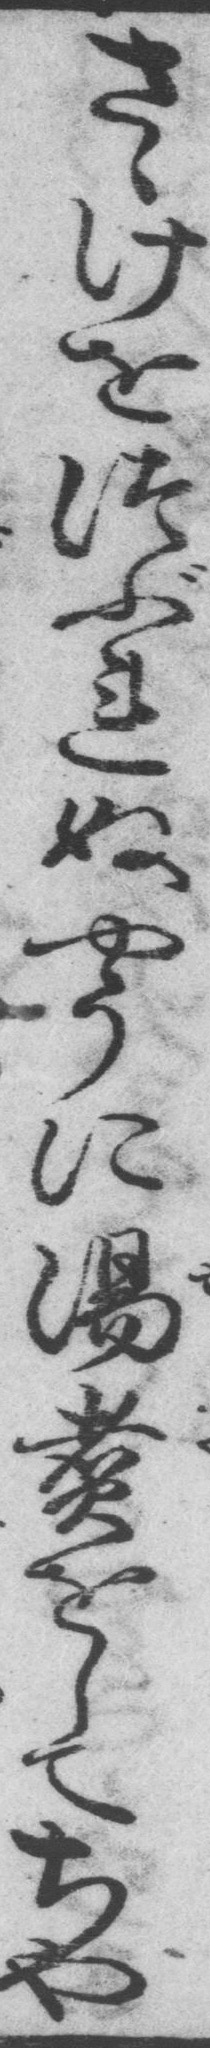さゝけを徒ぶ連ぬやうに湯煮をしてちや
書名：料理伊呂波庖丁
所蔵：大阪府立大学学術情報センター 国文学研究資料館
